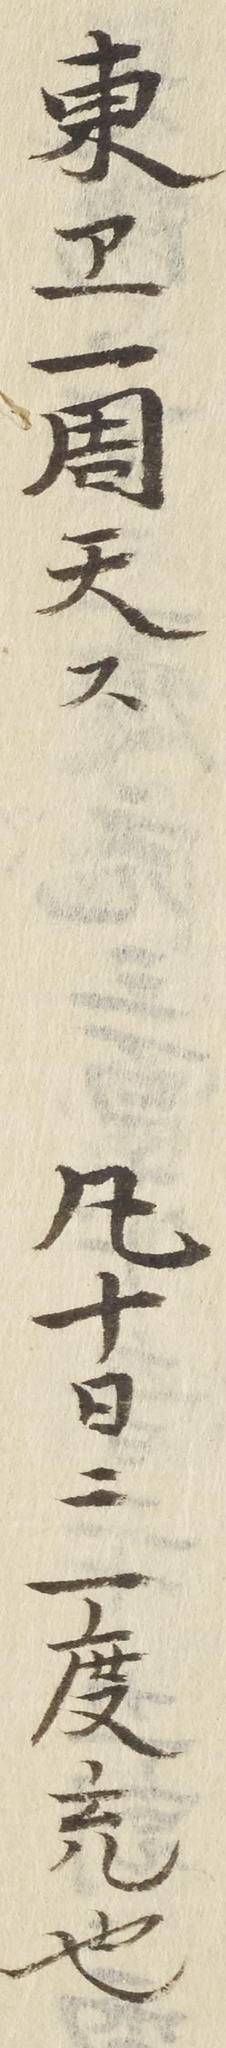東ヱ一周天ス凡十日ニ一度充也
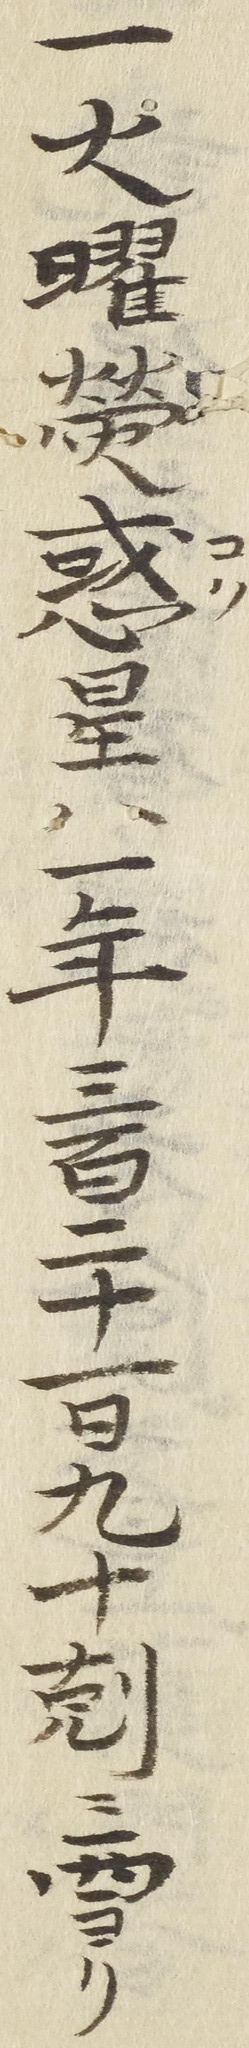一火曜熒惑星ハ一年三百二十一日九十刻ニ西ヨリ
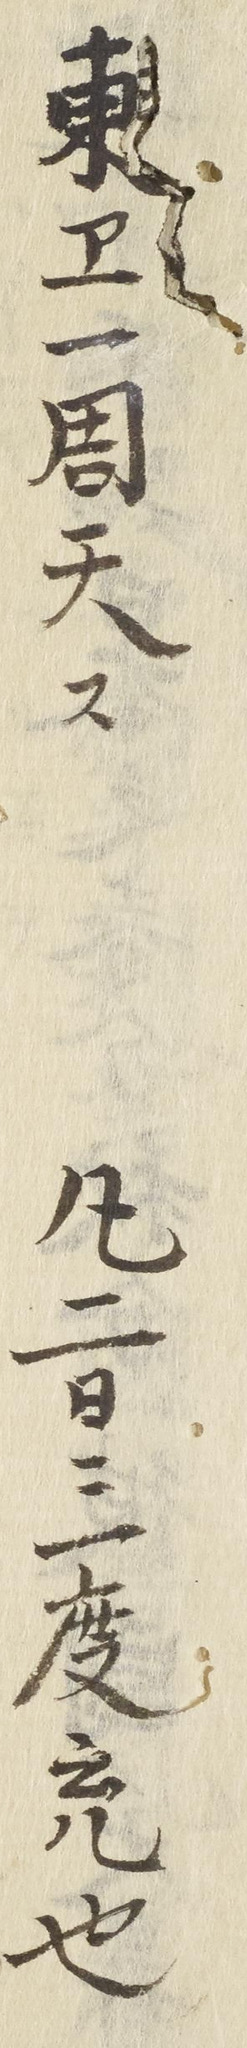東ヱ一周天ス凡二日三度充也
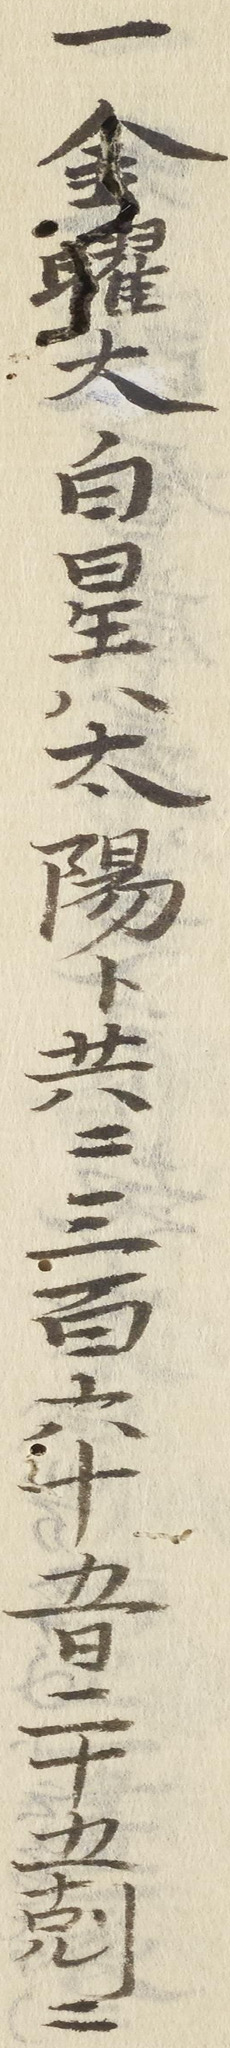一金曜大白星ハ太陽ト共ニ三百六十五日二十五剋ニ
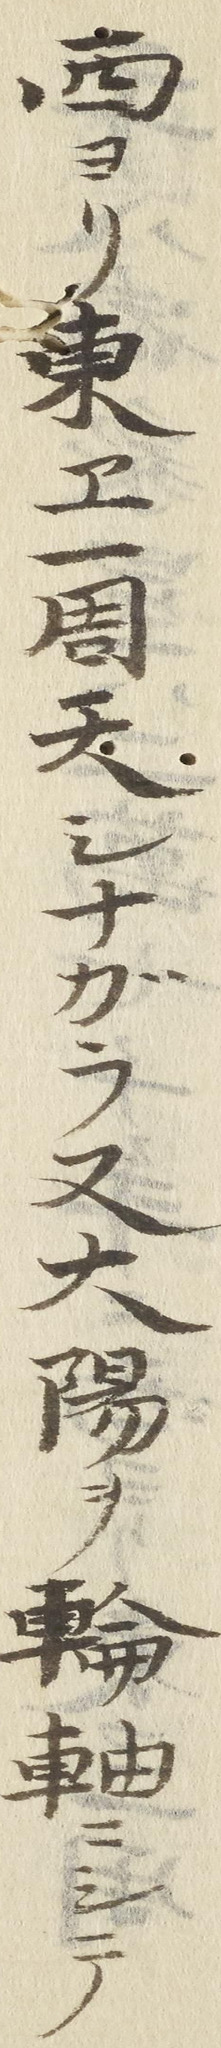西ヨリ東ヱ一周天シナガラ又大陽ヲ輪軸ニシテ
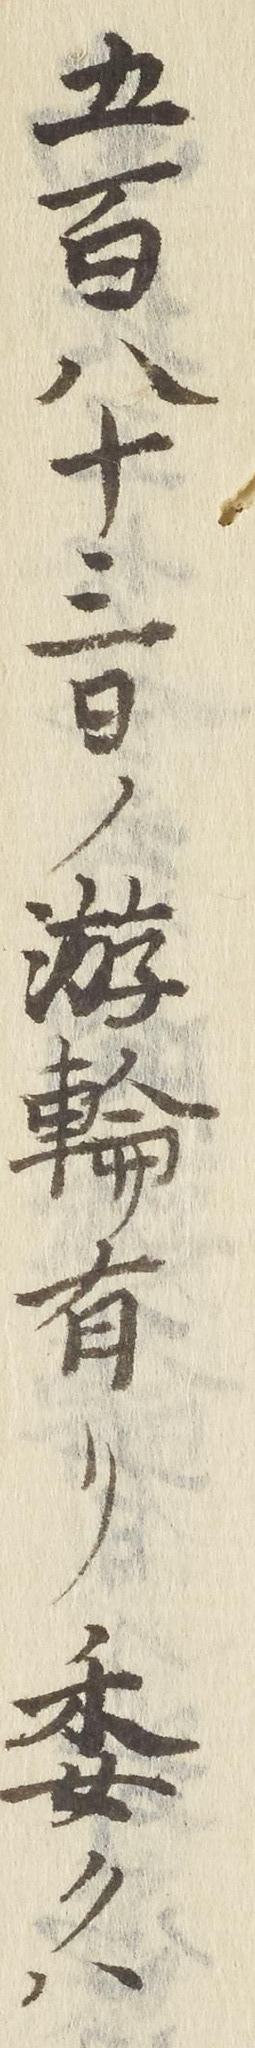五百八十三日ノ游輪有リ委クハ
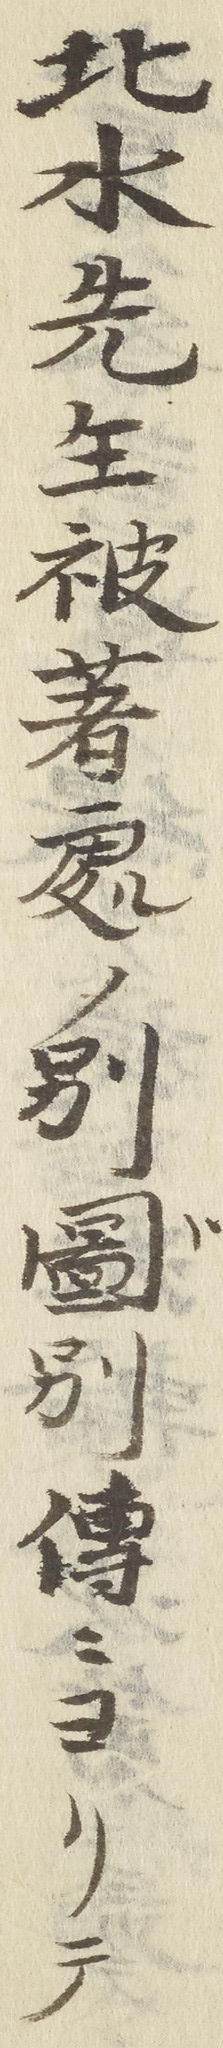北水先生被著処ノ別国別伝ニヨリテ
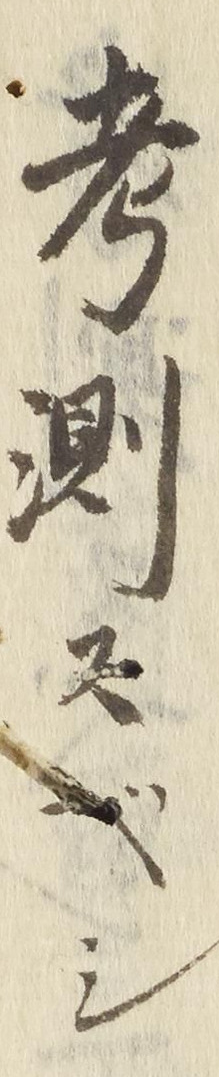考測スベシ
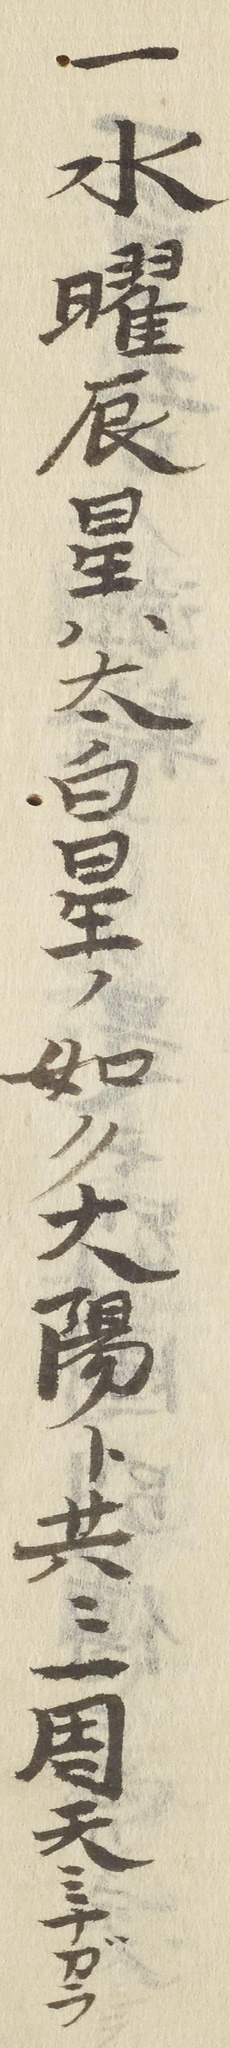一水曜辰星ハ太白星ノ如ク大陽ト共ニ一周天ミナガラ

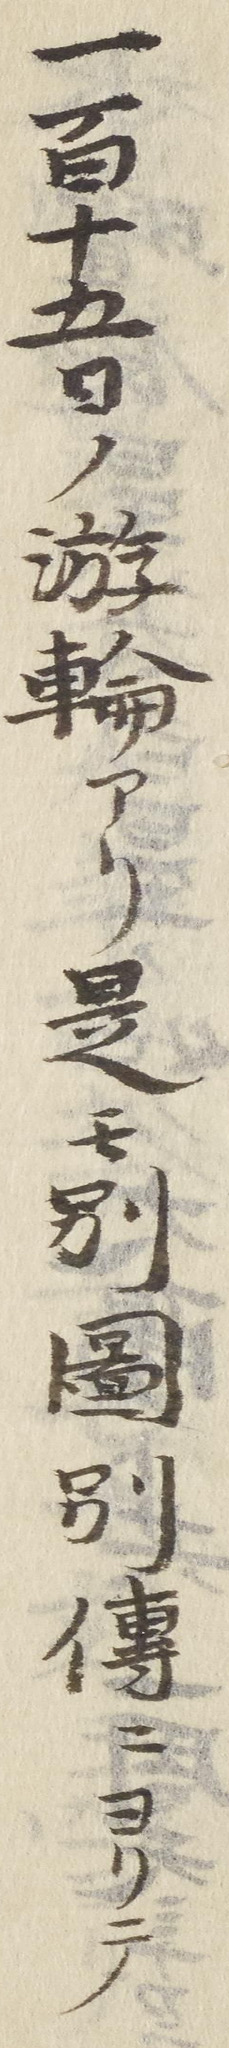一百十五日ノ游輪アリ是モ別国別伝ニヨリテ
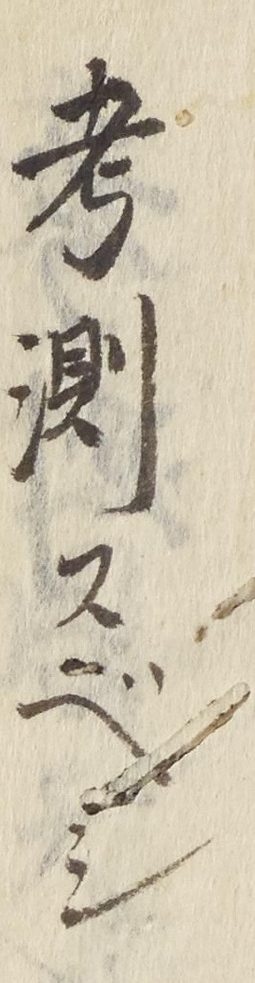考測スベシ
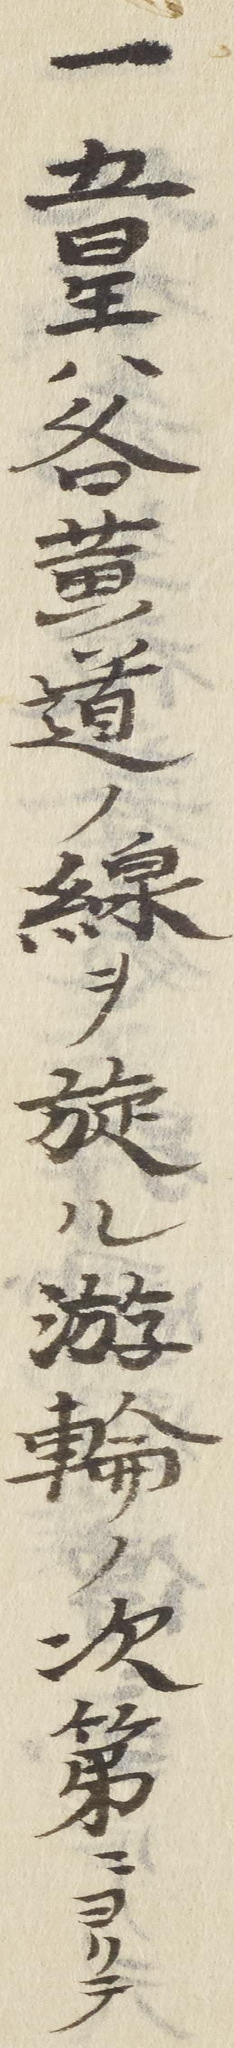一五星ハ各黄道ノ線ヲ旋ル游輪ノ次第ニヨリテ
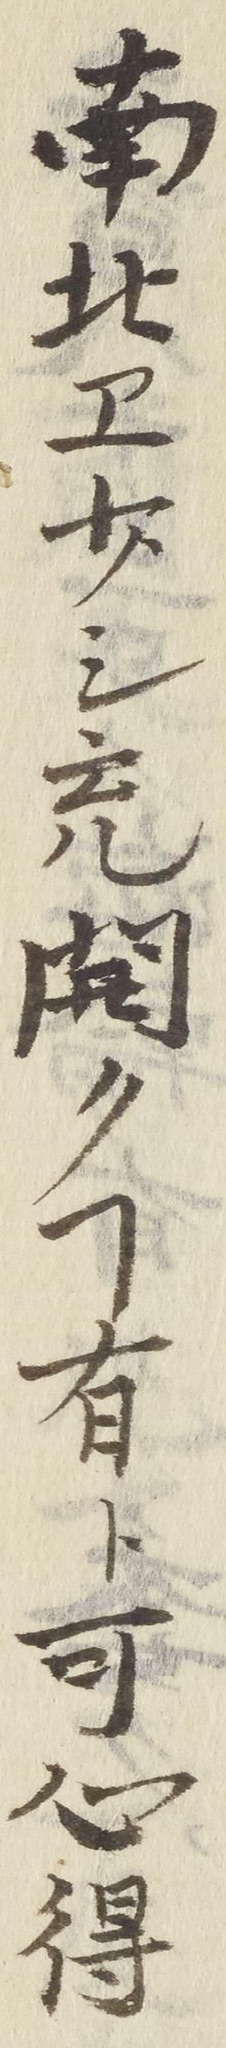南北ヱ少シ充開クコト有ト可心得
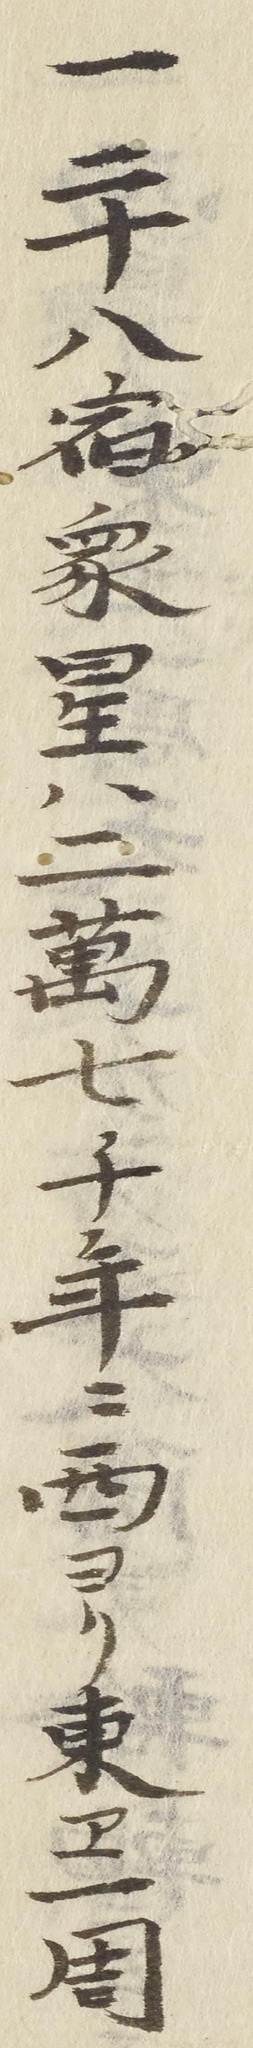一二十八宿衆星ハ二万七千年ニ西ヨリ東ヱ一周
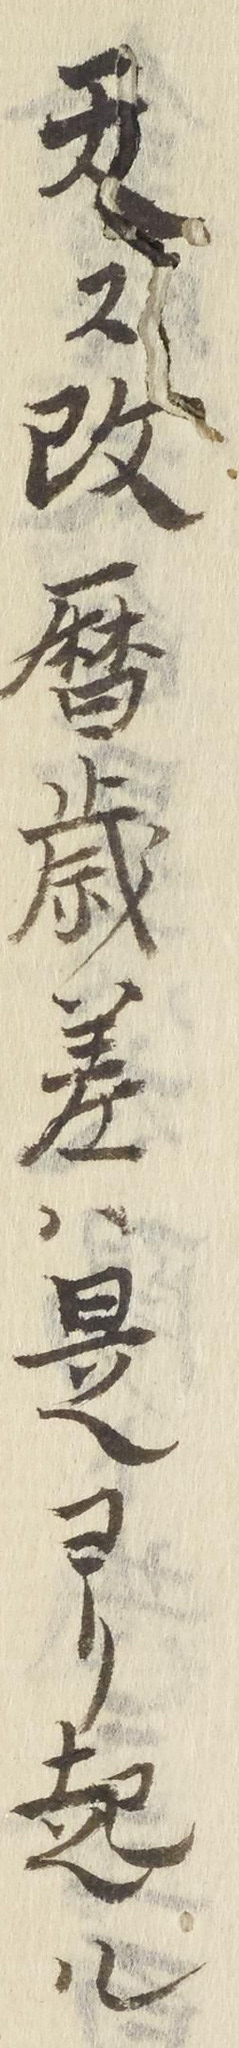天ス改暦歳差ハ是ヨリ起ル
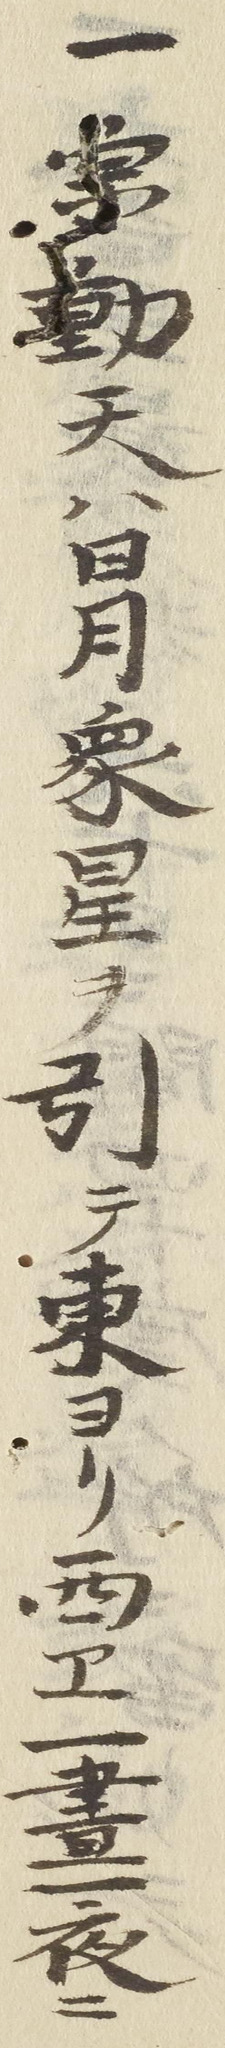一宗動天ハ日月衆星ヲ引テ東ヨリ西ヱ一昼一夜ニ
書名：天象話説
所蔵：東京大学地震研究所図書室 Earthquake Research Institute Library, The University of Tokyo, JAPAN
